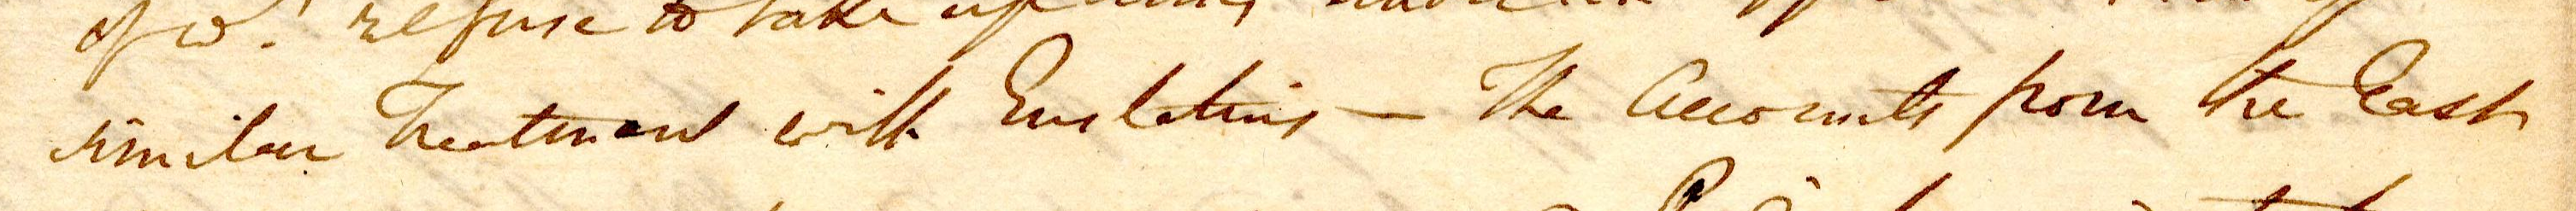similar Treatment will Enstations- The Accounts from the East
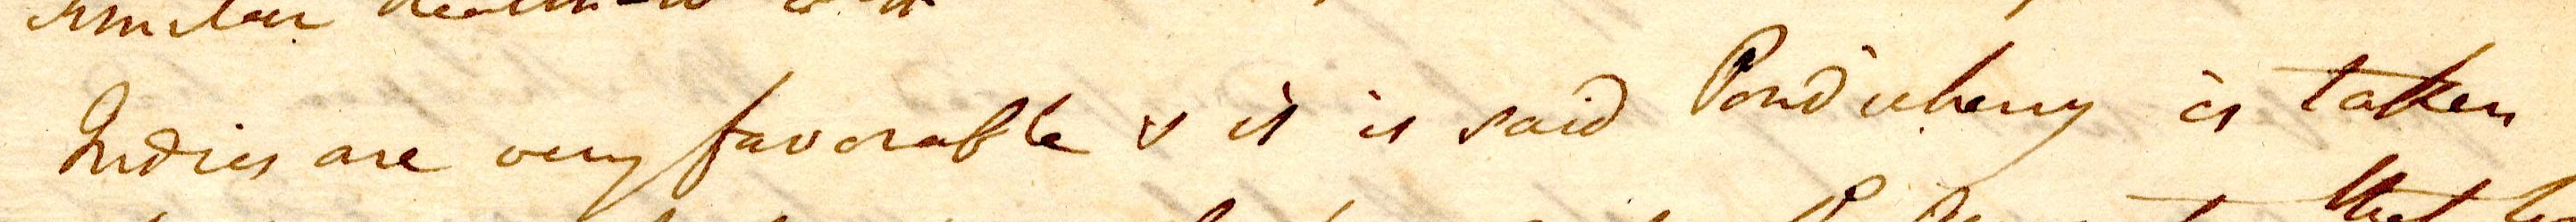Indies are very favorable & it is said Pondicherry is taken
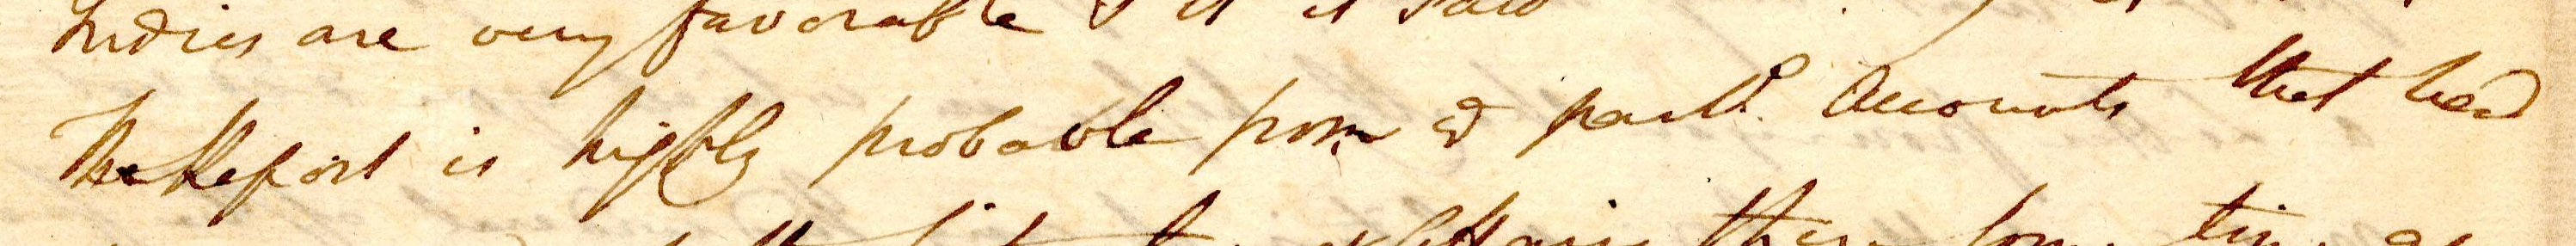The Report is highly probable from y^e part^l Accounts that had
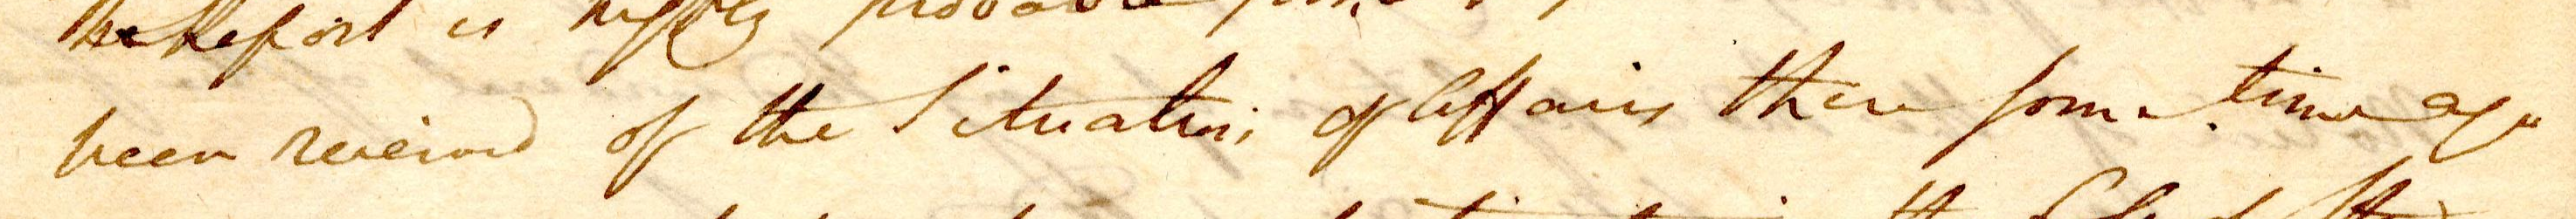been received of the Situation of Affairs there some time ago
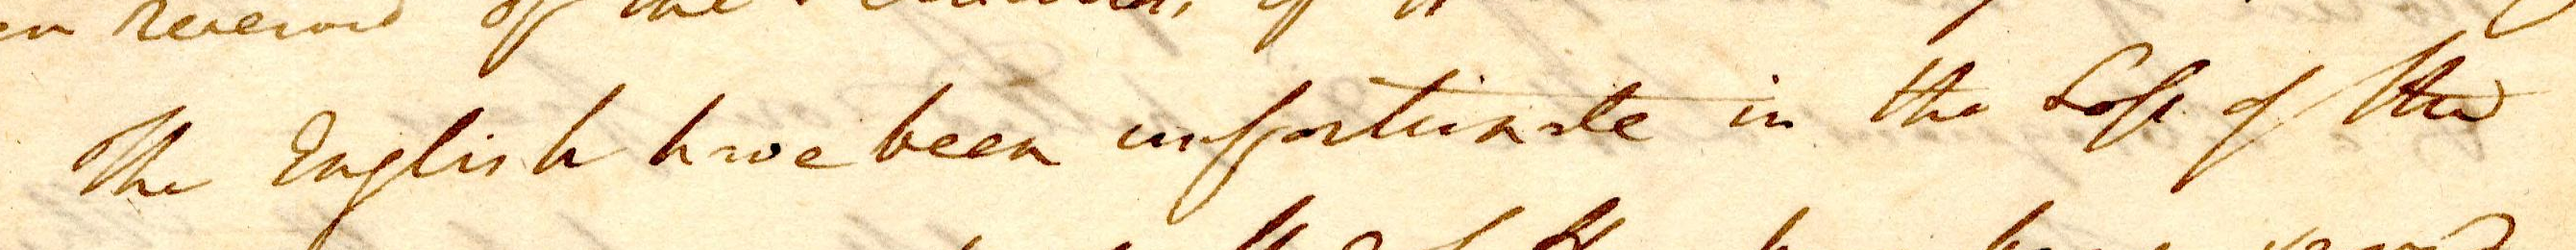The English have been unfortunate in the Loss of the
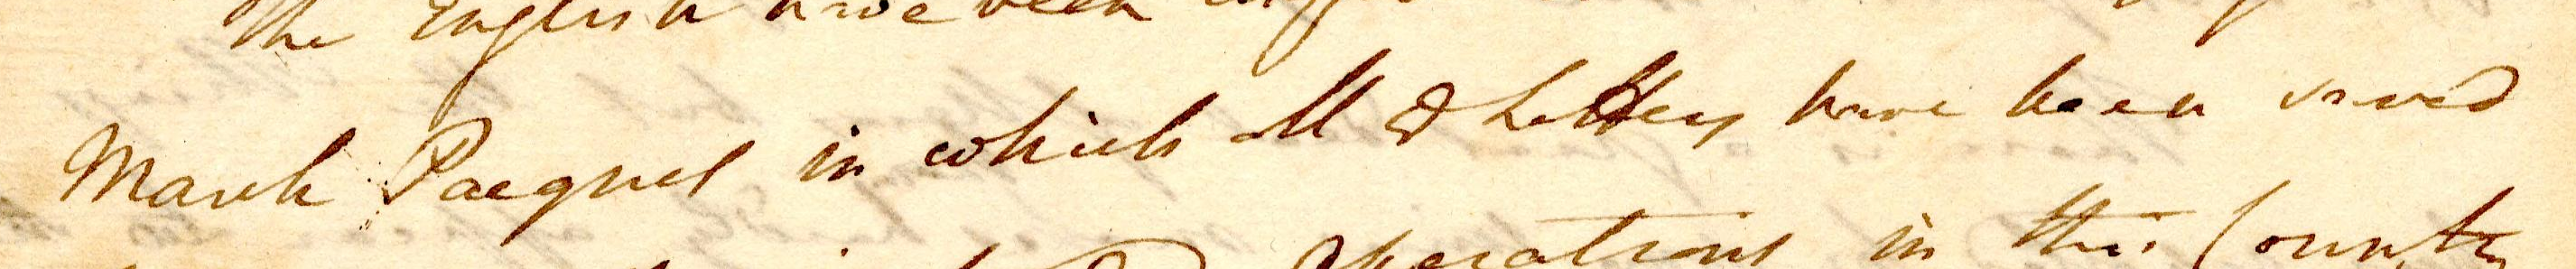March Paegnet in which all y^e Letters have been saved
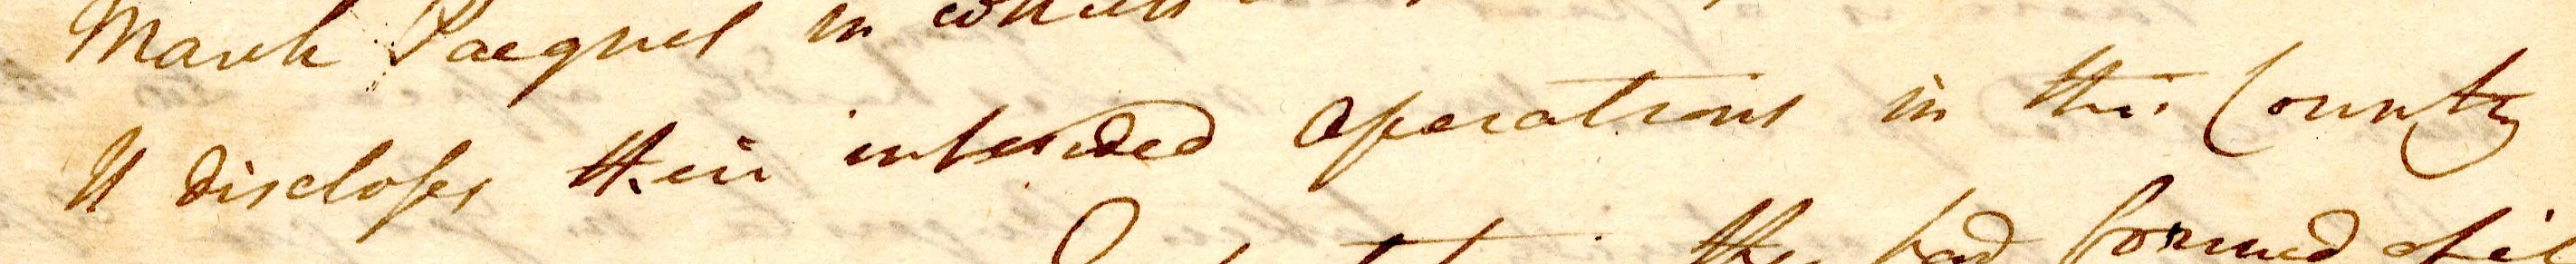& discloses their intended operations in the Country
